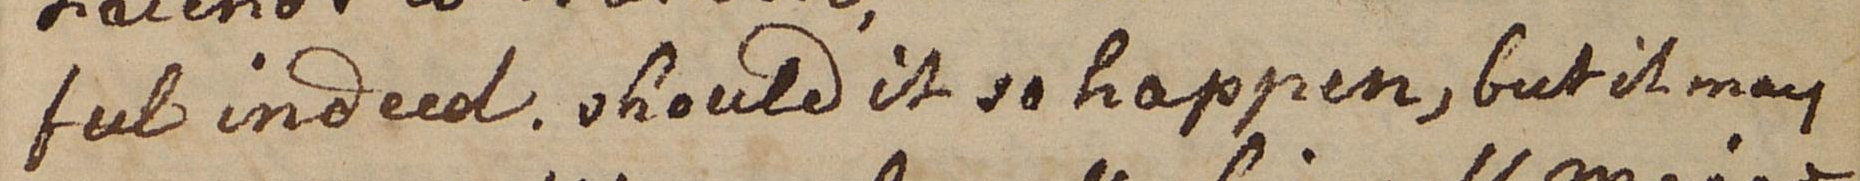ful indeed should it so happen, but it may
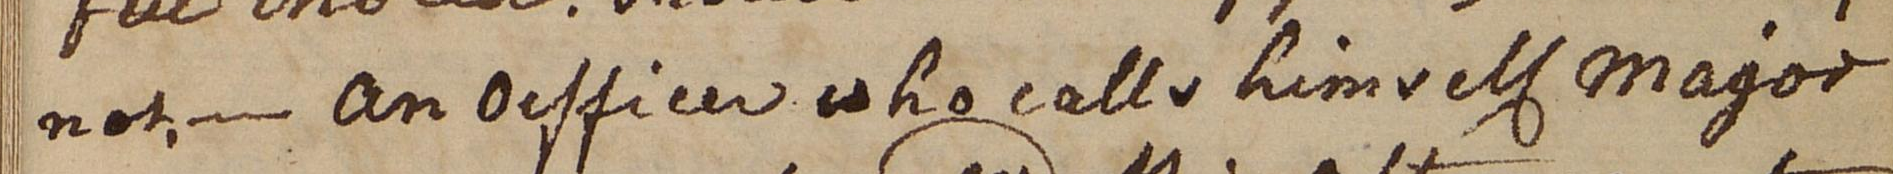not.- An Oifficer who calls himself Major
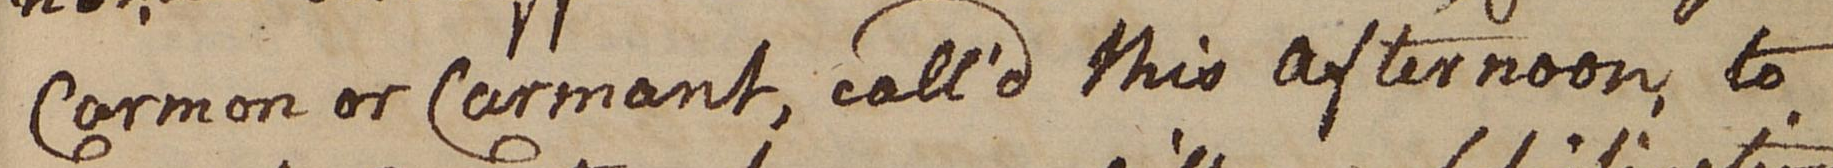Corman or Carmant, call'd this Afternoon, to
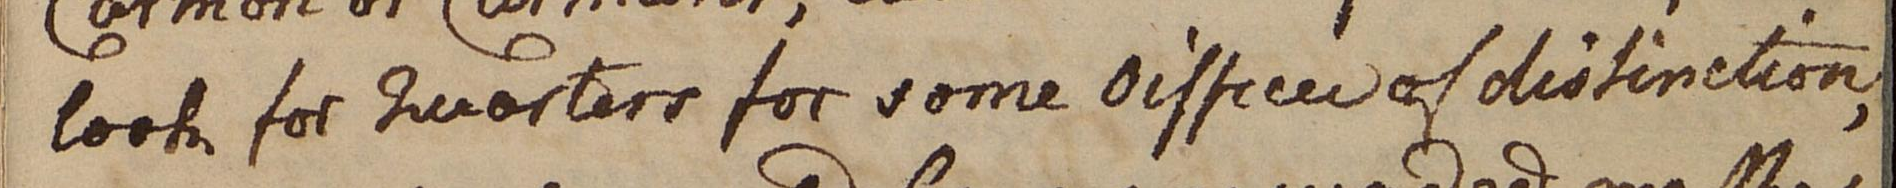look for Quarters for some Oifficer of distinction,
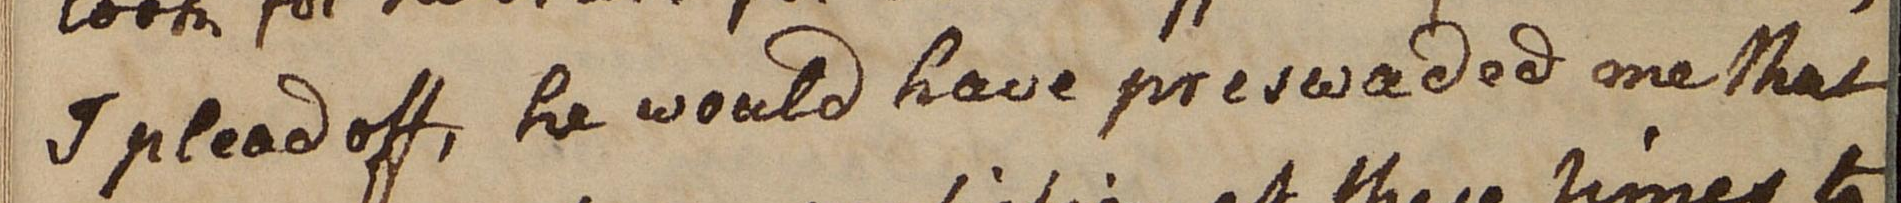I plead off, he would have preswaded me that
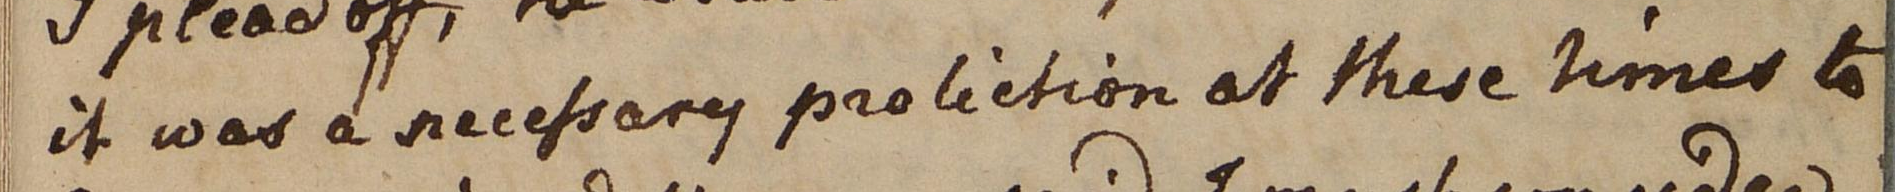it was a necessary proliction at these times to
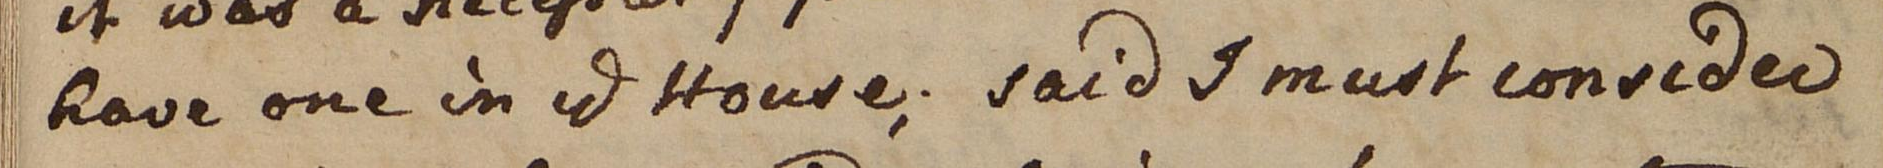have one in y^e House; said I must consider
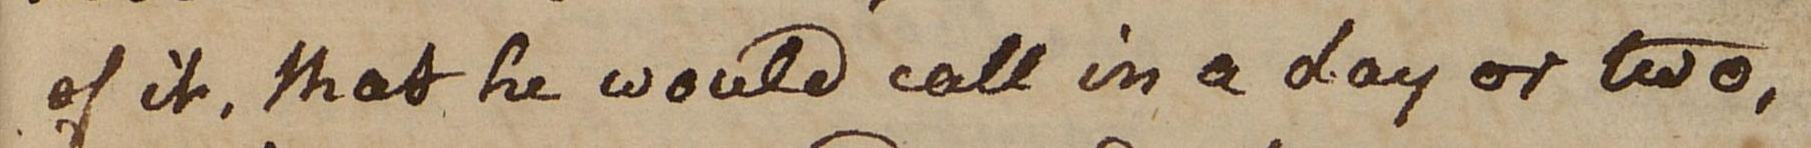of it, that he would call in a day or two,
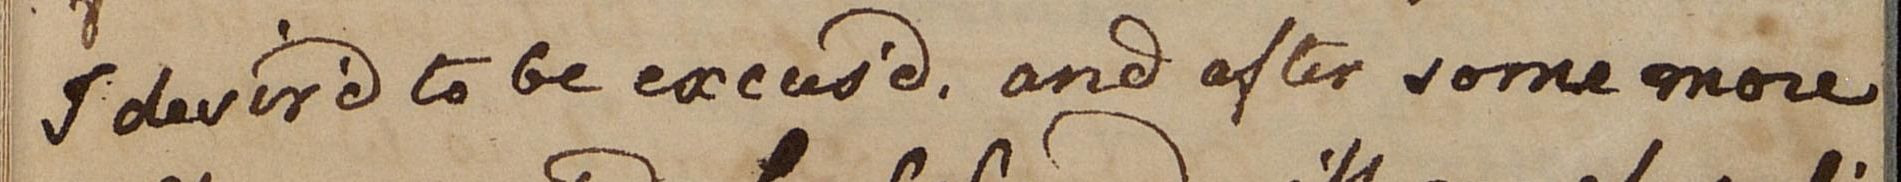I desir'd to be excus'd, and after some more
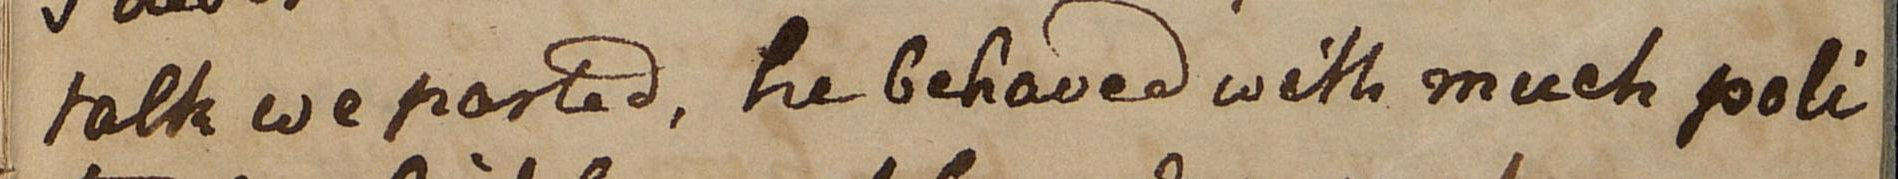talk we parted, he behaved with much poli
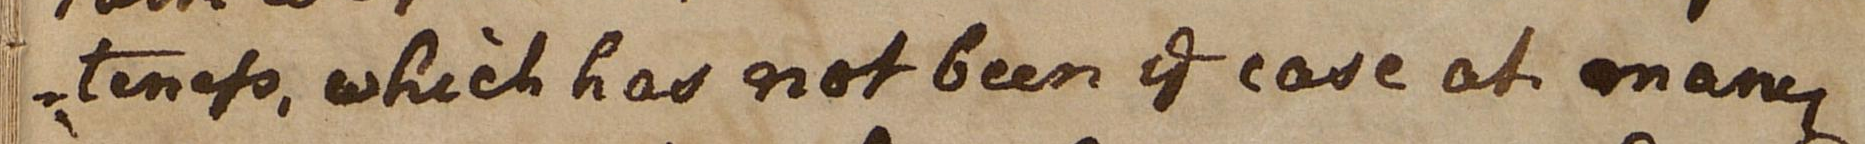-teness, which has not been y^e case at many
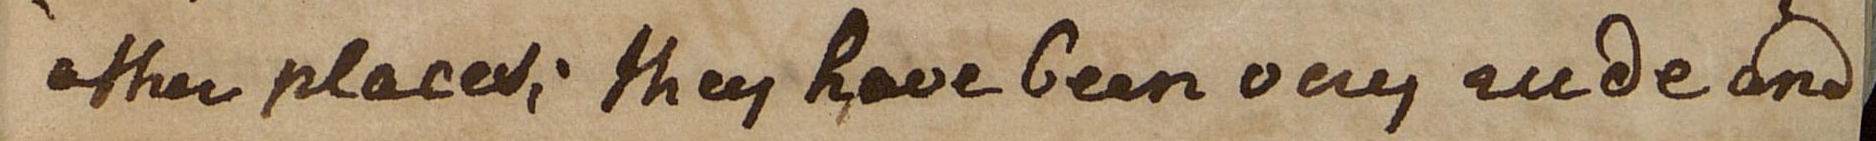other places; they have been very rude and
